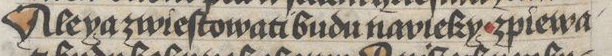Ale ya zwieſtowati budu navieky.zpiewa¬
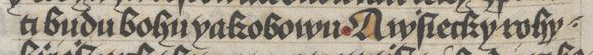ti budu bohu yakobowu.A wẛiecky rohy
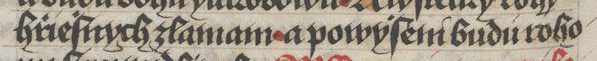hṙieẛnych zlamam.a powyẛeni budú roho¬
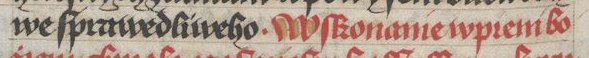we ſprawedliweho.Wſkonanie w pieni bo¬
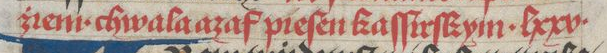żiem.chwala azaf pieſen kaſſirſkym.lxxv.
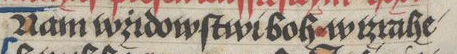Nam wżidowſtwi boh.w izrahe¬
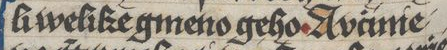li welike gmeno geho.A vċinie¬
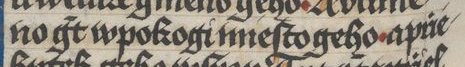no ḡt wpokogi mieſto geho.a pṙe¬
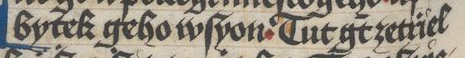bytek geho wſyon.Tut ḡt zetṙiel
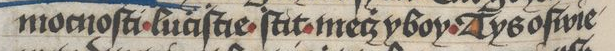mocnoſti.luċiſtie.ẛtit.mecż y boy.Tys oſwie¬
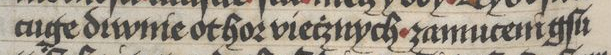cuge diwnie ot hor viecżnych.zamuceni gſu
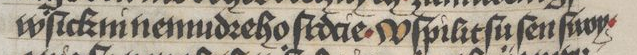wẛickni nemudreho ſrdcie.Vſpilit ſu ſen ſwoy.
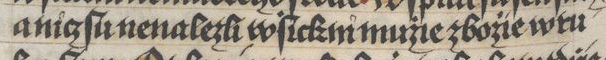a niczſu nenalezli vẛickni mużie zbożie wru¬
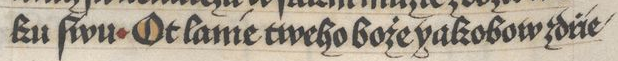ku ſwu.Ot lanie tweho boże yakobow zdṙíe¬
